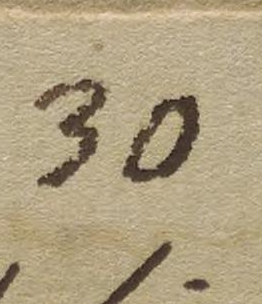30
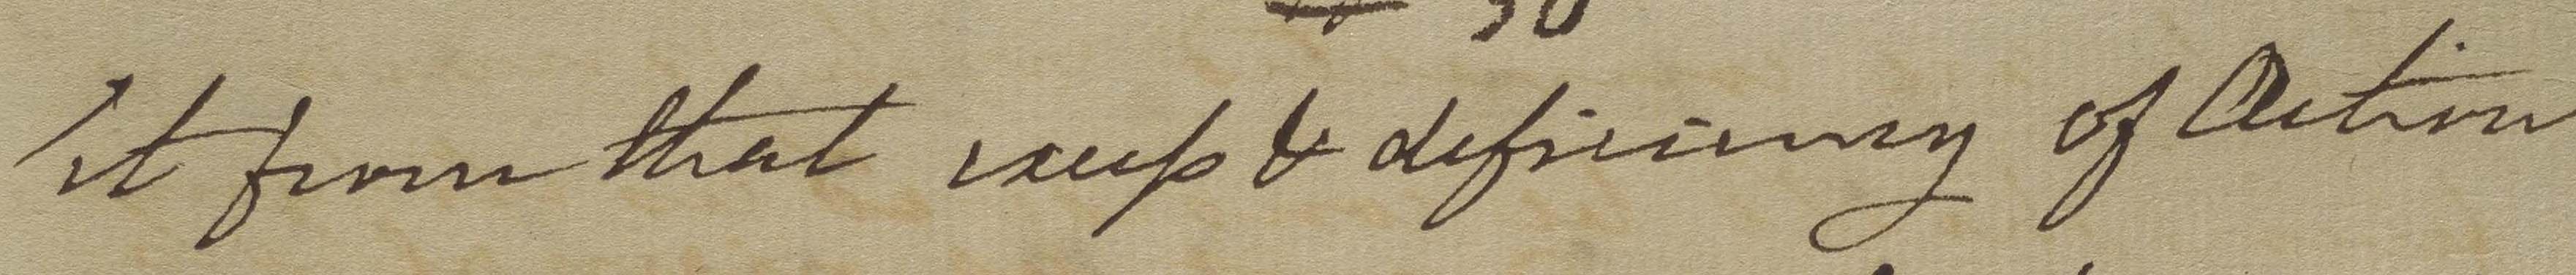It from that excess & deficiency of Action
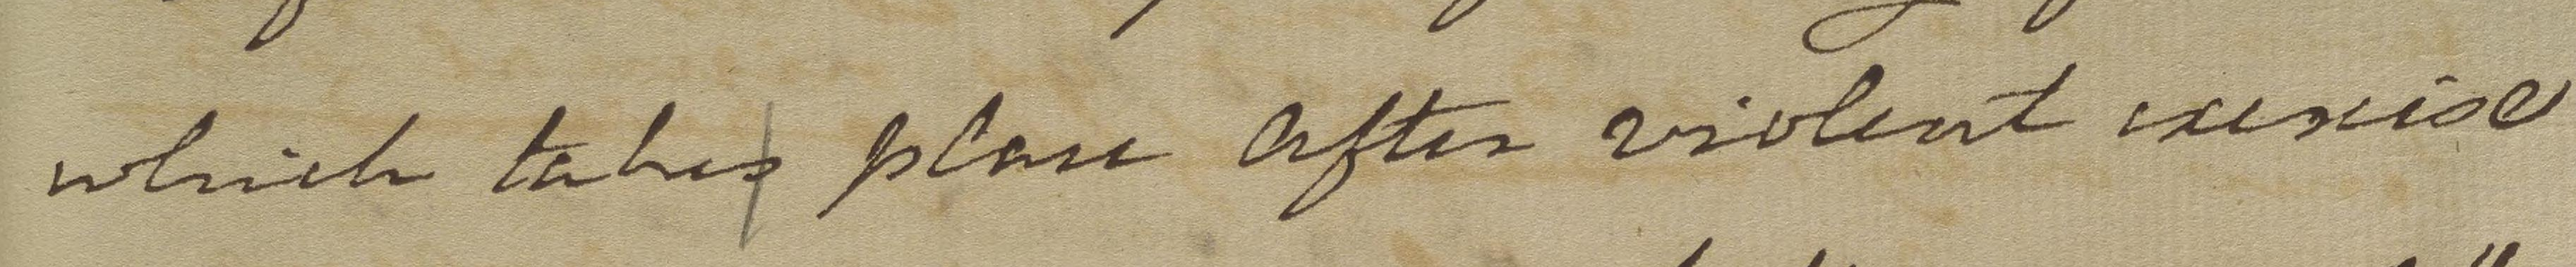which takes place after violent exercise
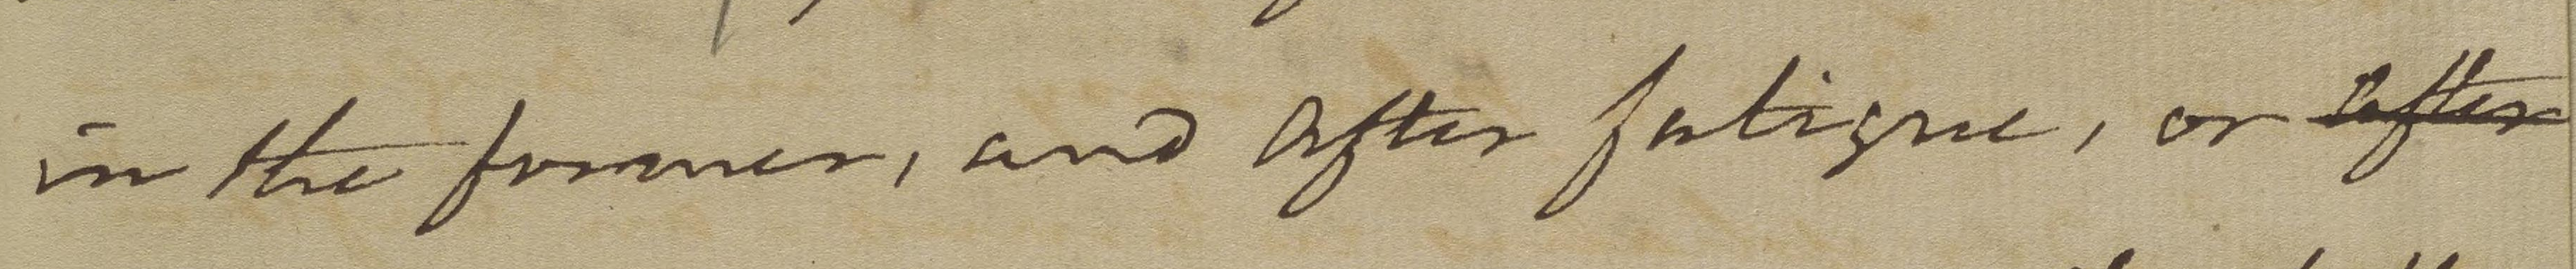in the former, and after fatigue, or [After]
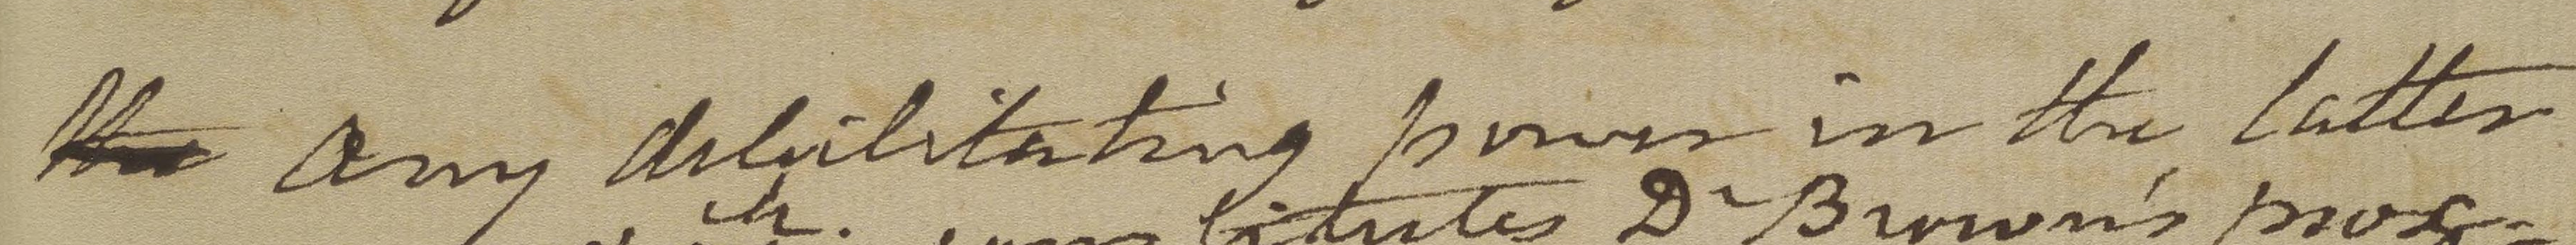[the] any debilitating power in the latter
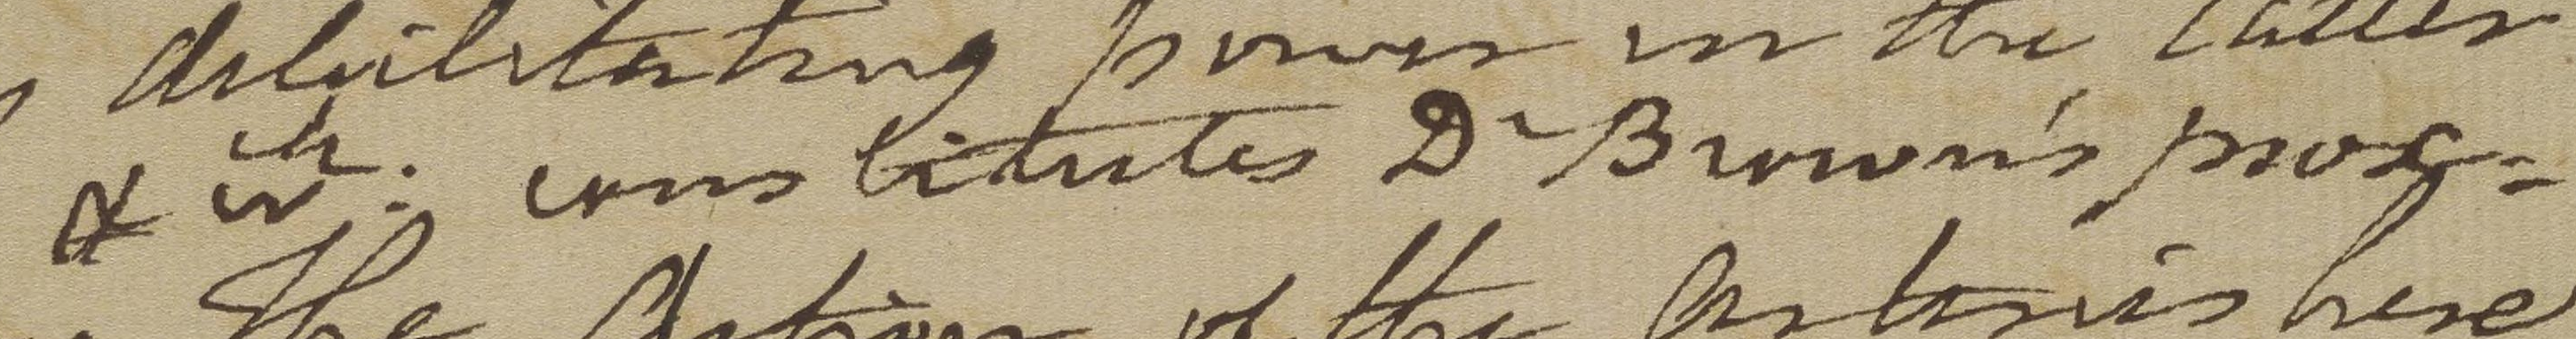& w^ch constitutes D^r Brown's prox-
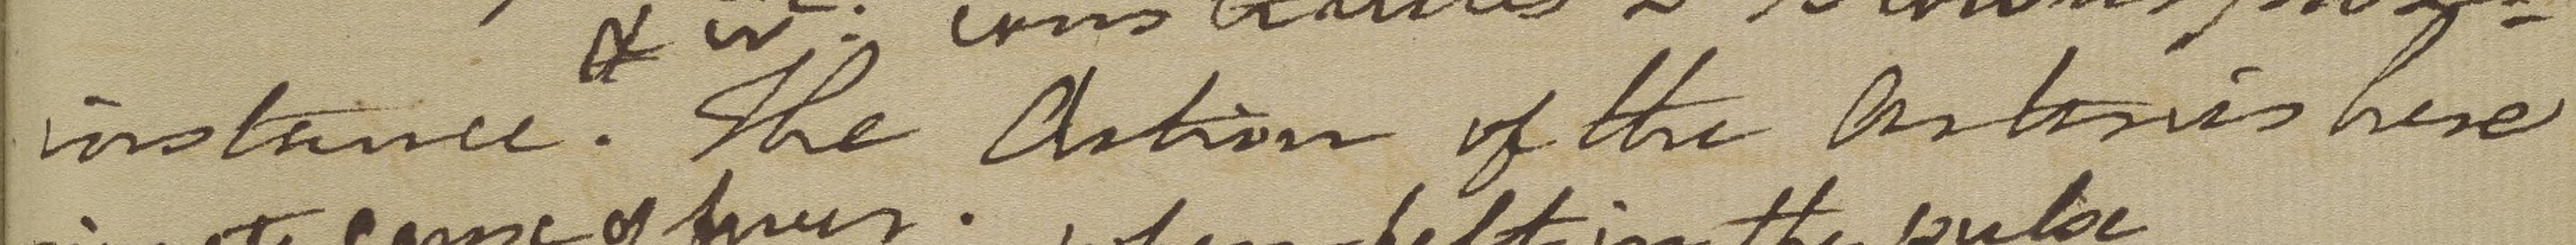instance. The action of the arteries here
